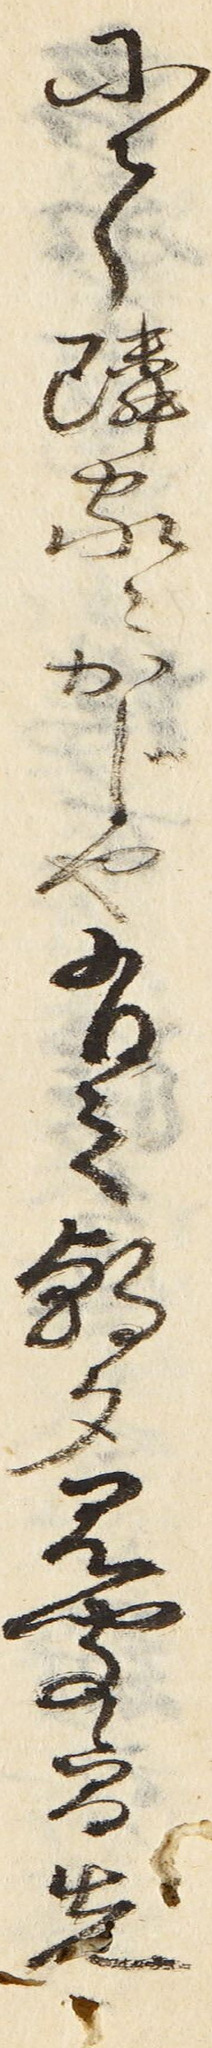にて隣家ニかじや有之朝夕見聞候間先
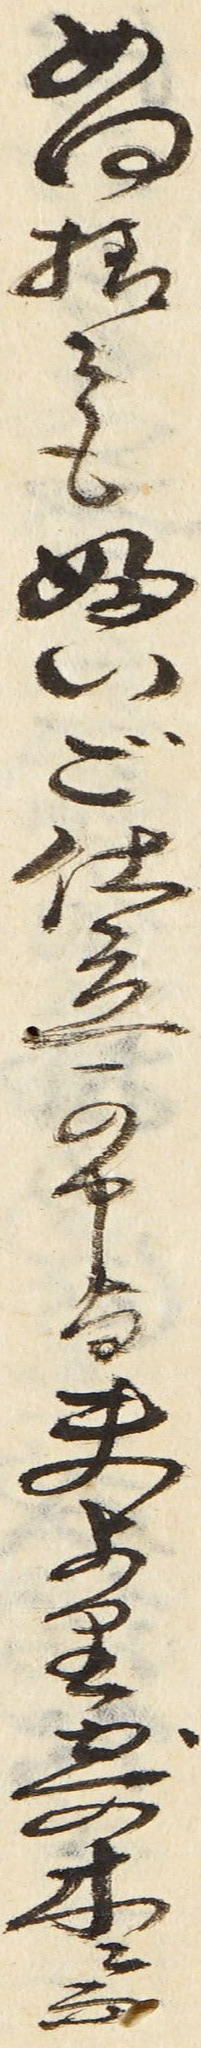如何様ニもふいご仕立可申与夫より寄木ニ而
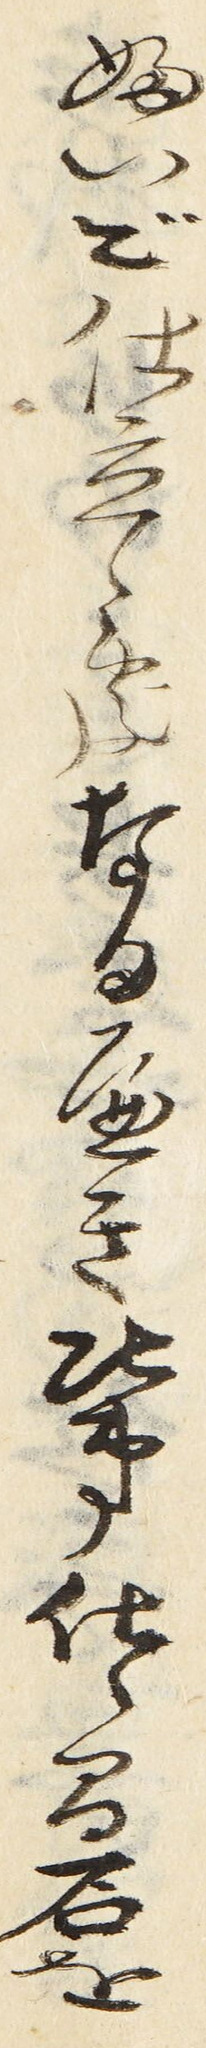ふいご仕立候処なるへき次第仕候間石を
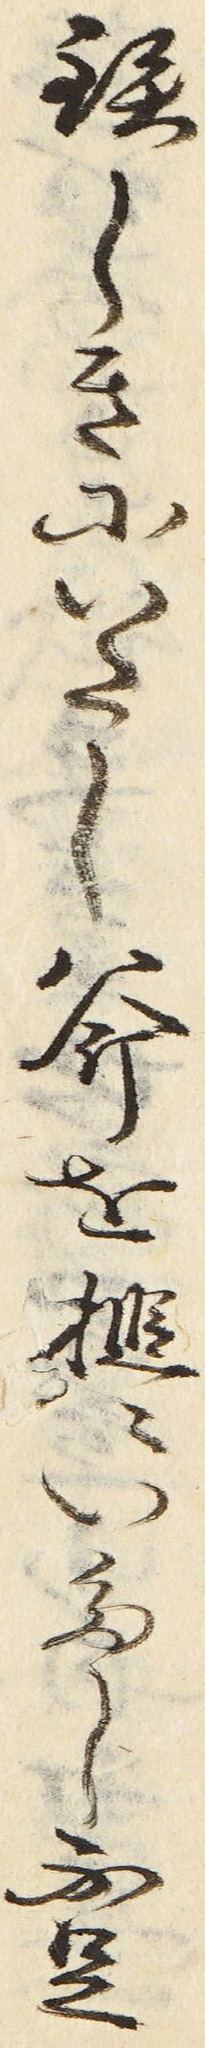鉄しきにいたし斧を槌ニいたし不足
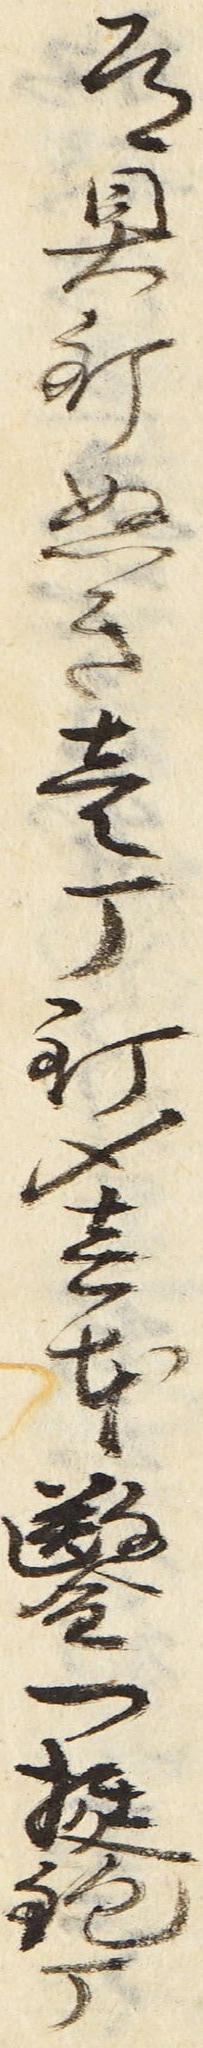道具釘ぬき壱丁釘〆壱本鑿一挺鉋丁
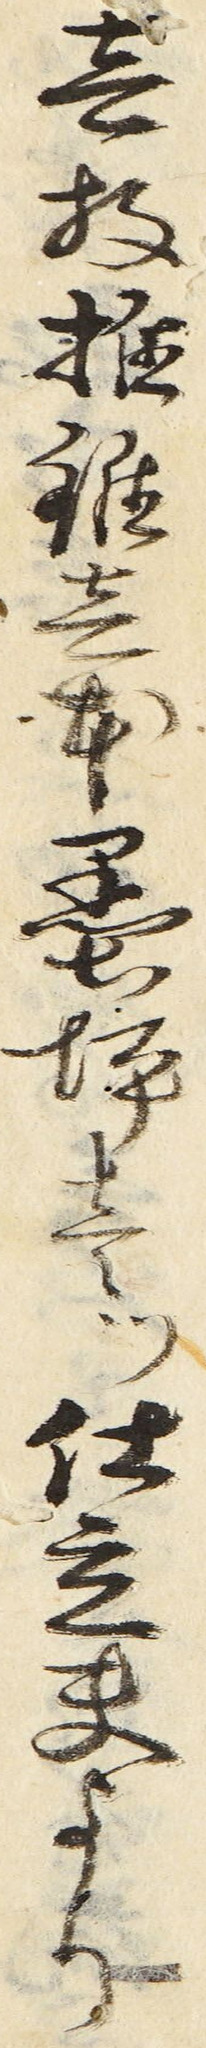壱枚推錐壱本墨坪壱ツ仕立夫より
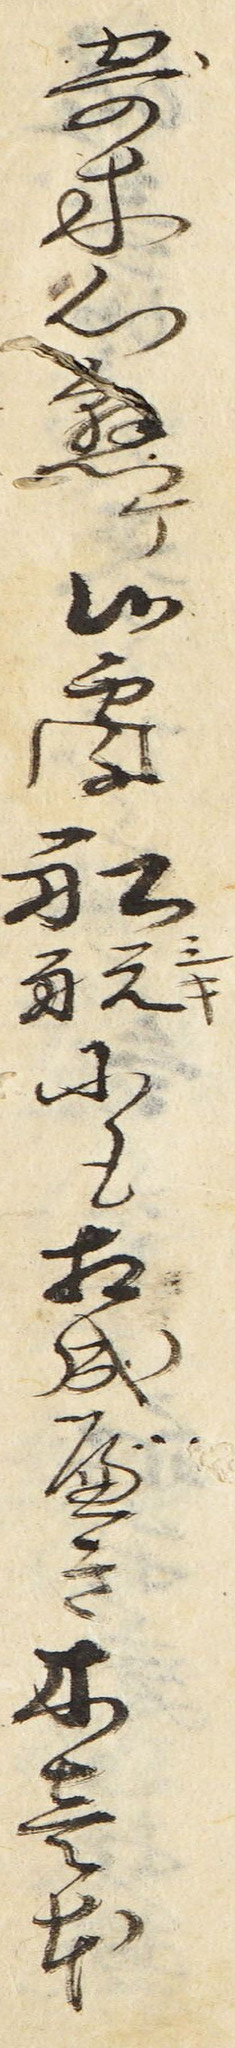寄木心懸ケ候処船にも相成べき木壱本

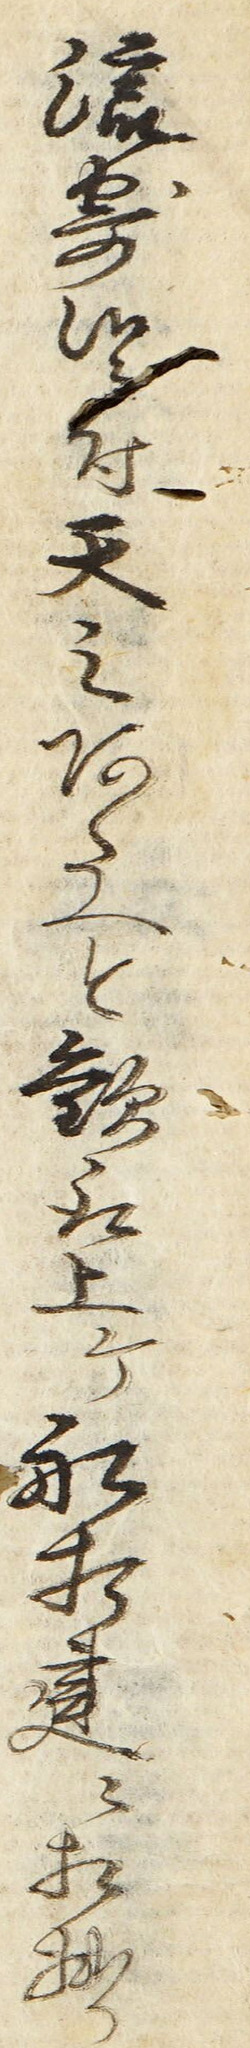流寄候ニ付天之あたへと歓取上ケ船打建ニ相掛り
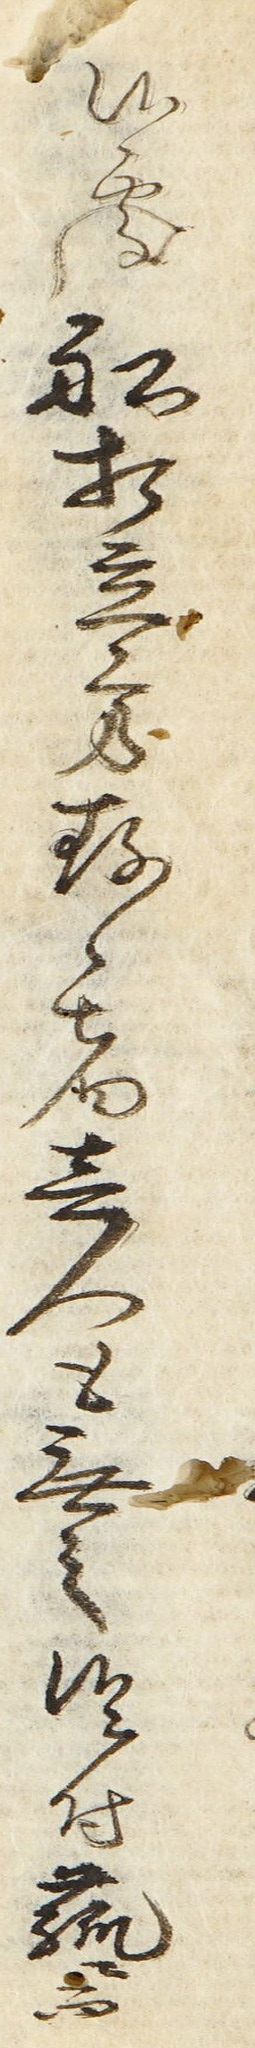候処船打立方存候者壱人も無之候ニ付菰ニ而
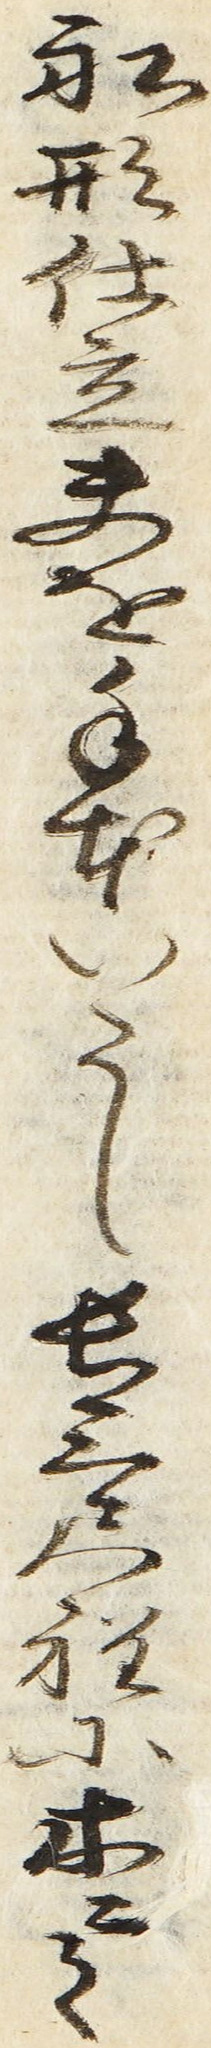船形仕立夫を手本いたし長三尺程に木ニて
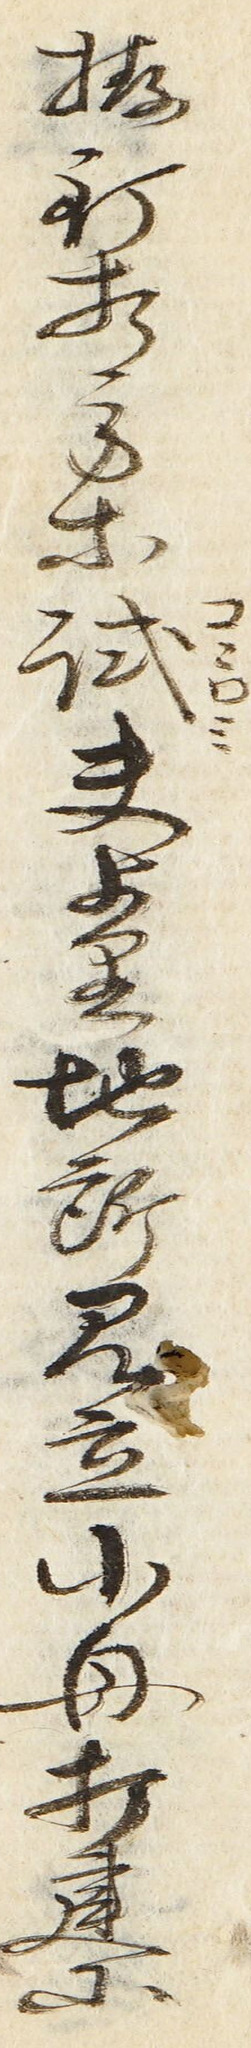拵釘打方等試夫より地所見立小舟打建に
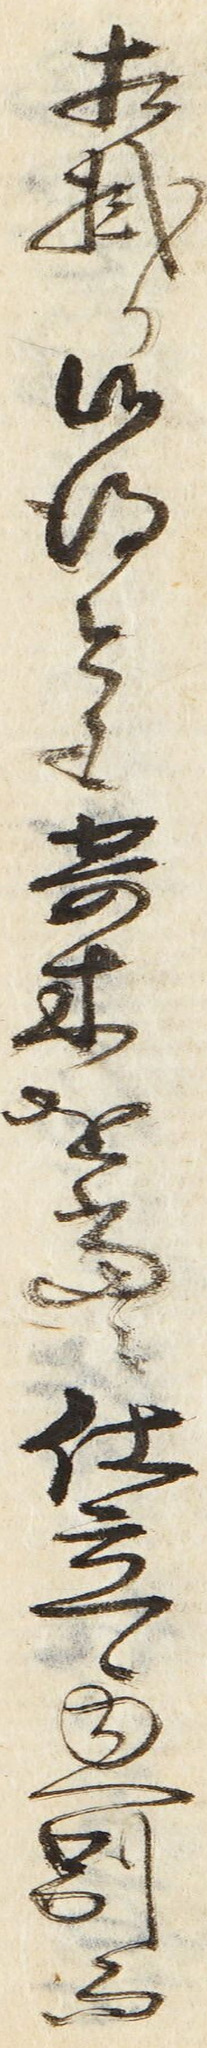相掛り候得とも寄木を当ニ仕立候ゆへ別而
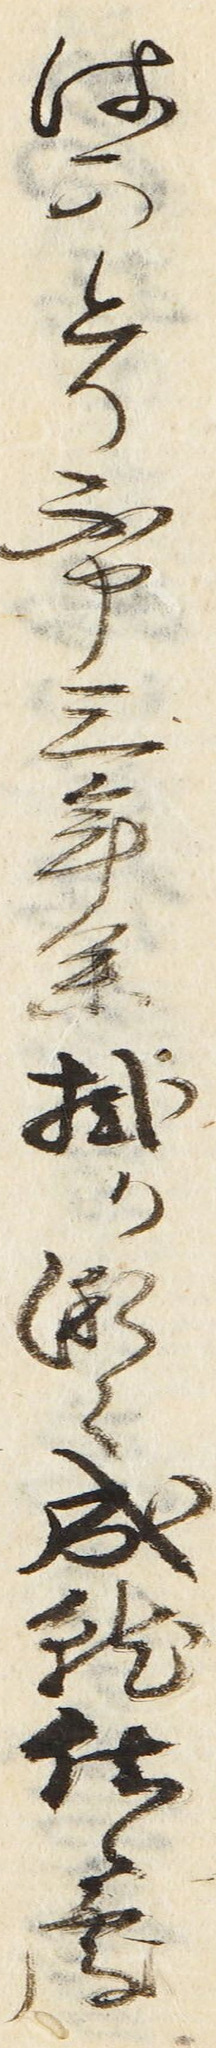はかとり不申三年余掛り漸々成就仕候処
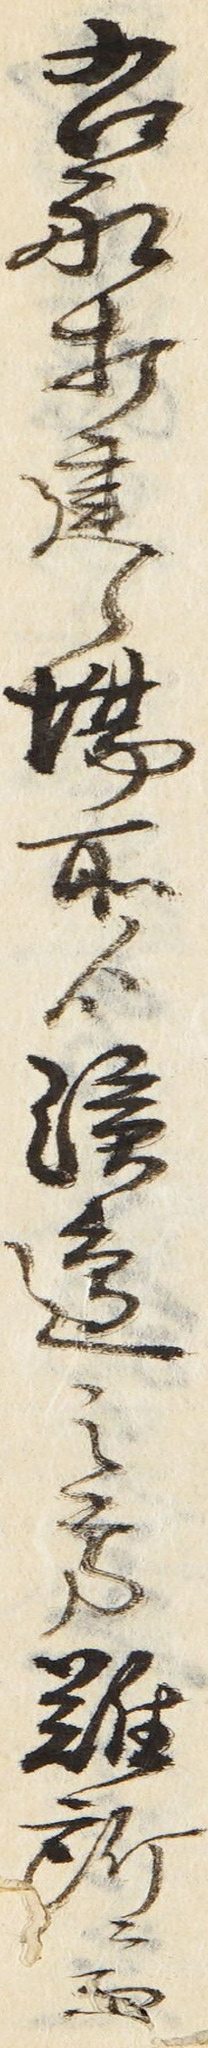右船打建候場所ゟ浜辺之方難所ニ而
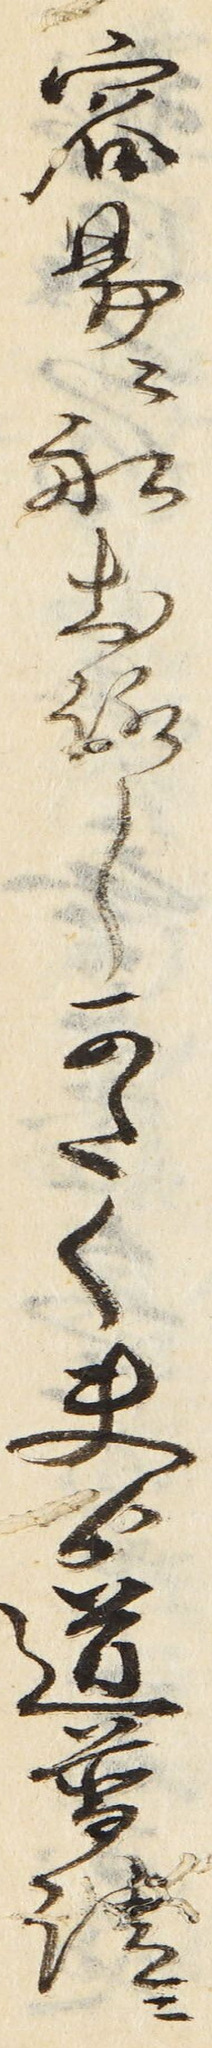容易ニ船おろしかたく夫ゟ道普請ニ
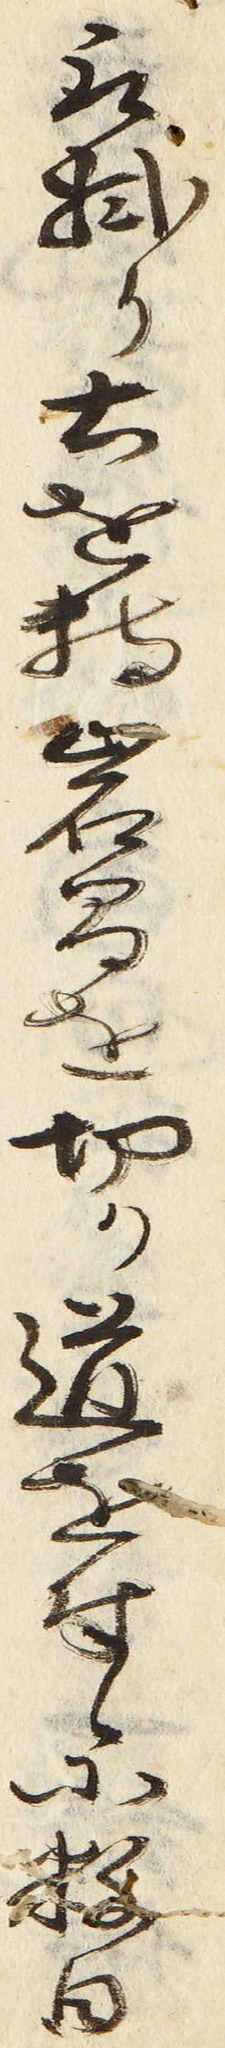取掛り土を持岩間を切り道を付候に数日
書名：漂流一件上書
